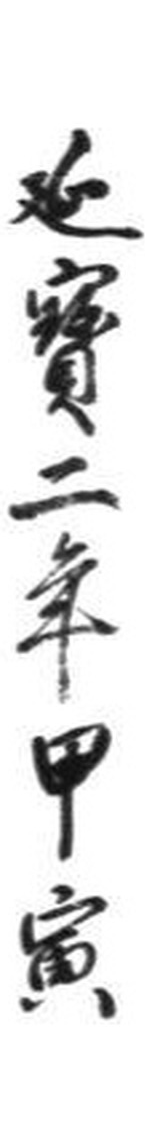延宝二年甲寅
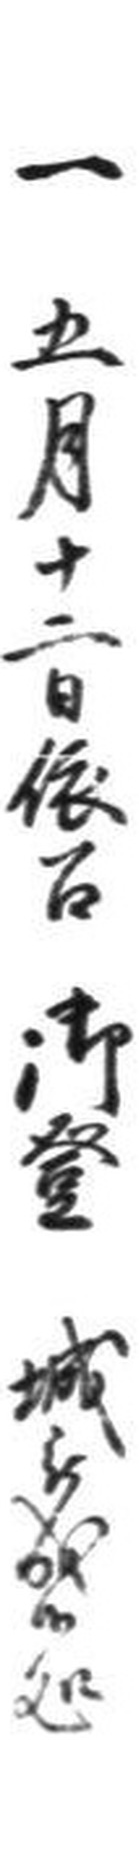一五月十二日依召御登城被成候処
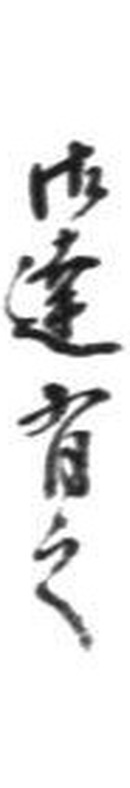御達有之
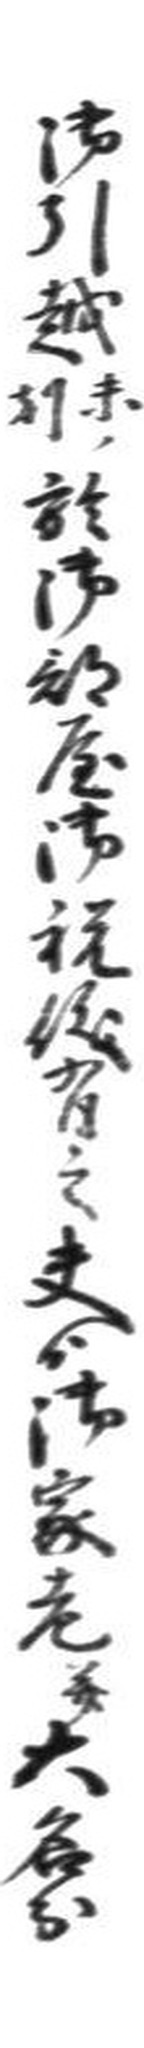御引越未ノ刻於御部屋御祝儀有之夫ゟ御家老并大名分
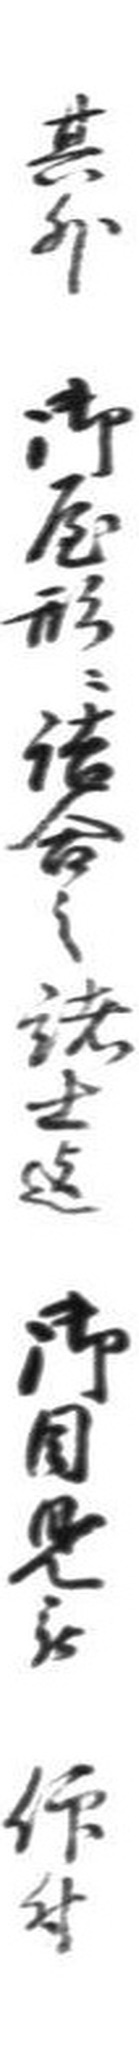其外御屋形ニ詰合之諸士迄御目見被
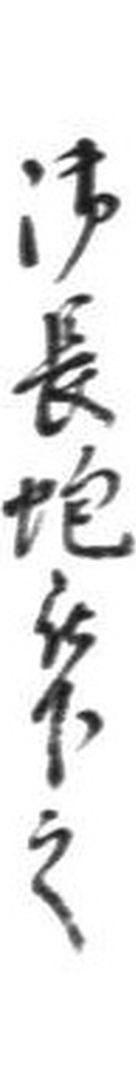御長蚫被下之

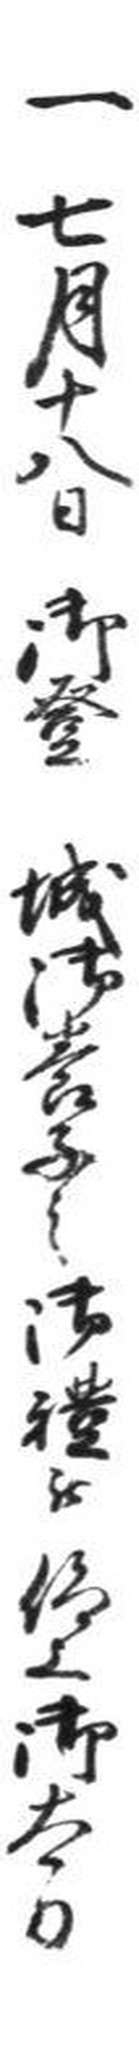一七月十八日御登城御養子之御礼被仰上御太刀
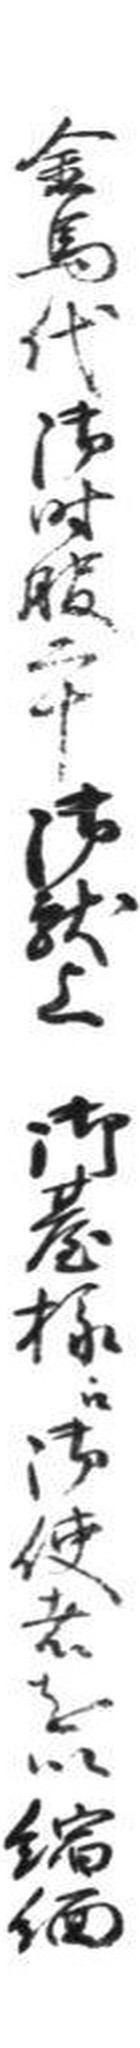金馬代御時服二十御献上御台様江御使者を以縮緬
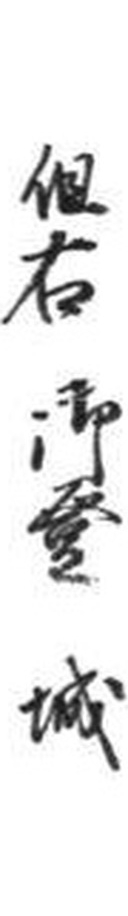只右御登城
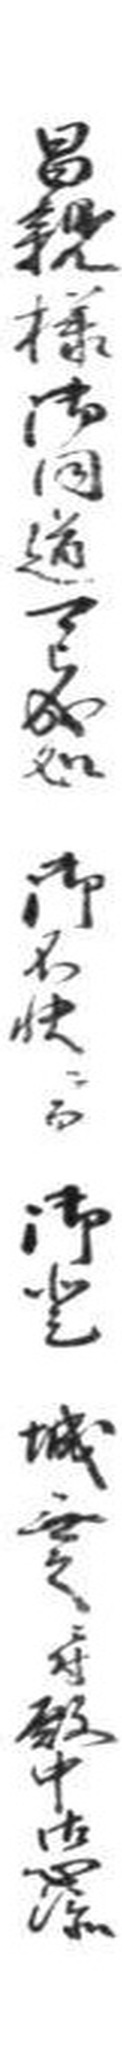昌親様御同道可被成処御不快ニ而御登城無之ニ付殿中御心添
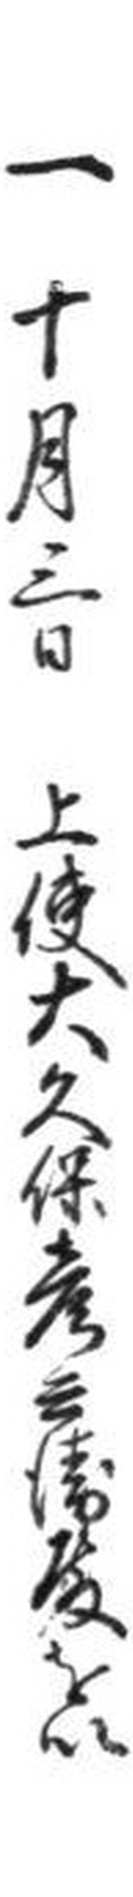一十月三日上使大久保彦兵衛殿を以
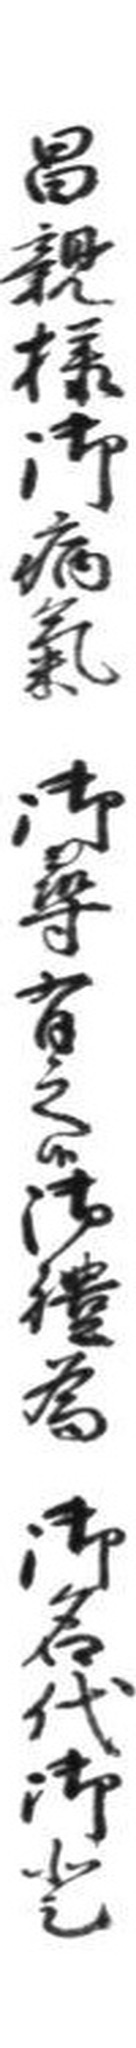昌親様御病気御尋有之候御礼為御名代御登
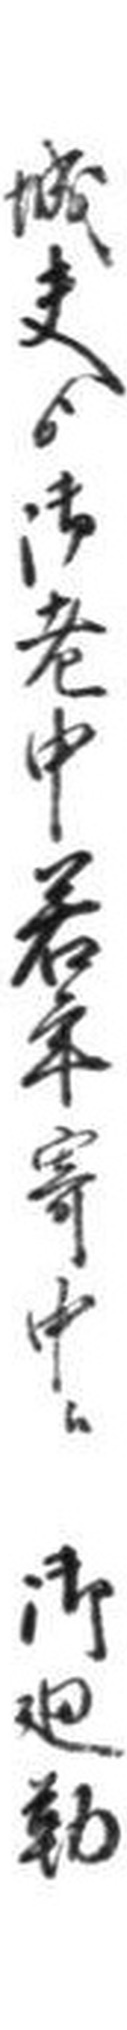城夫ゟ御老中若年寄中江御廻勤
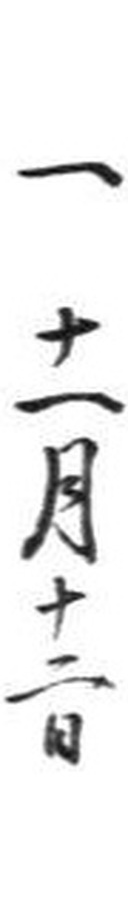一十一月十二日
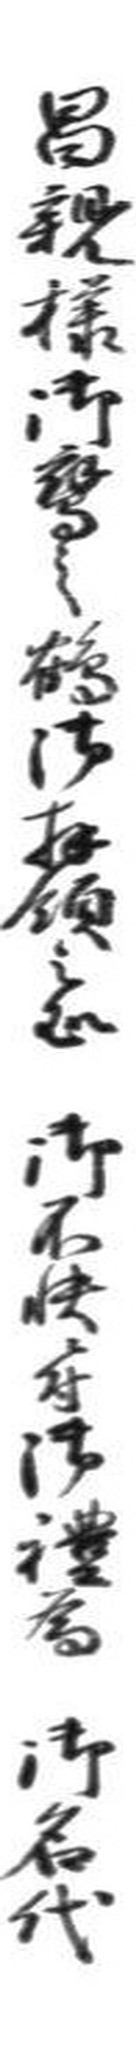昌親様御鷹之鶴御拝領之処御不快ニ付御礼為御
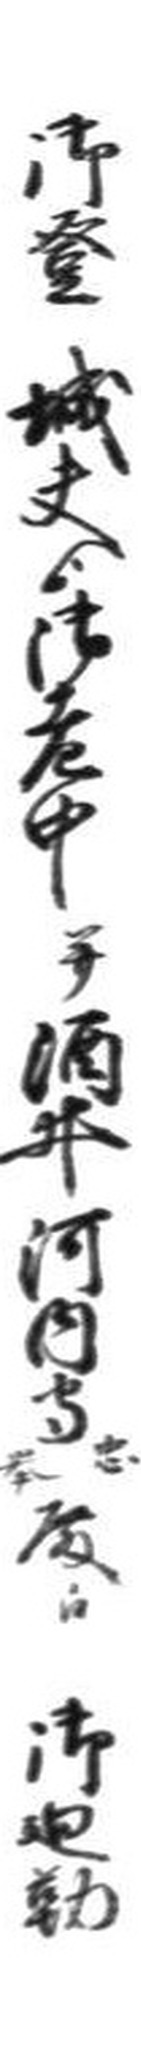御登城夫ゟ御老中并酒井河内守忠挙殿江御廻勤
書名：家譜 十三 綱昌公 従寛文元年到延宝五年
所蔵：福井県文書館 Fukui Prefectural Archives
